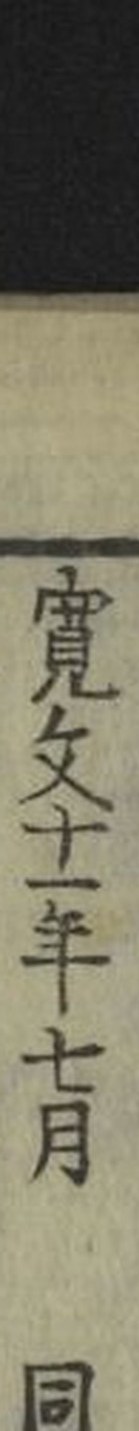寛文十一年七月同
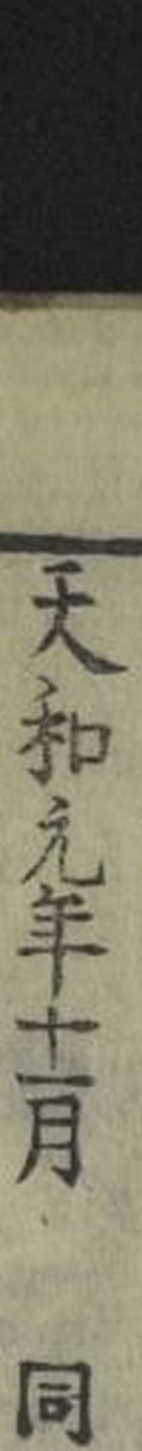天和元年十一月同
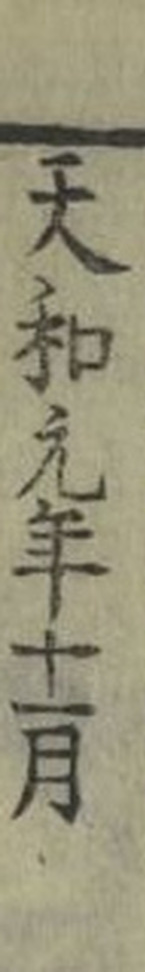天和元年十一月同
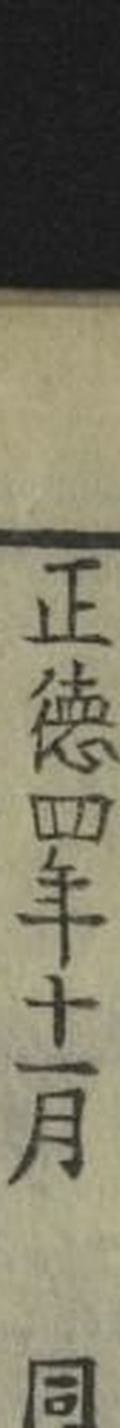正徳四年十一月同
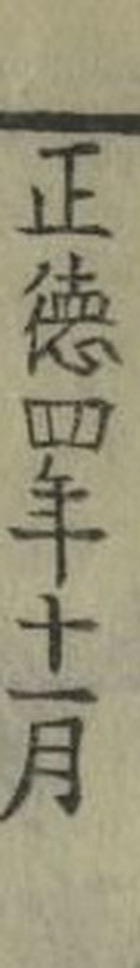正徳四年十一月同
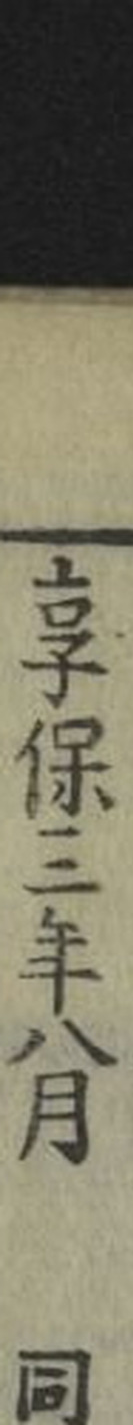享保三年八月同
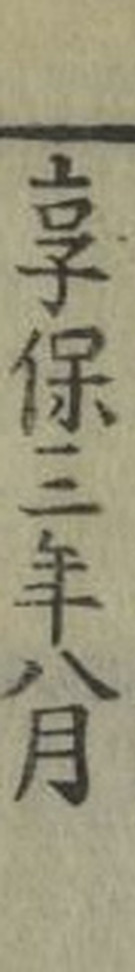享保三年八月同
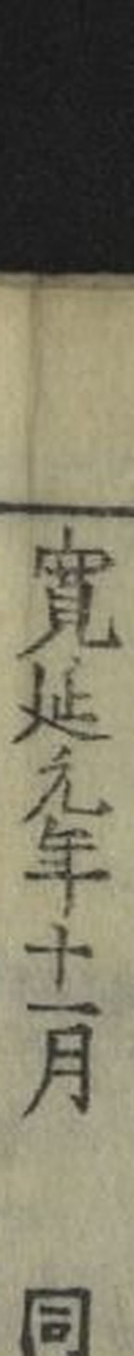寛延元年十一月同
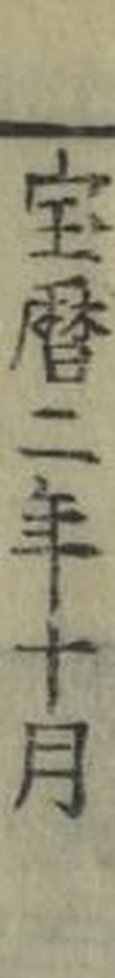宝暦二年十月同
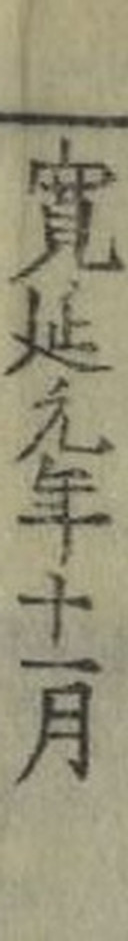寛延元年十一月同
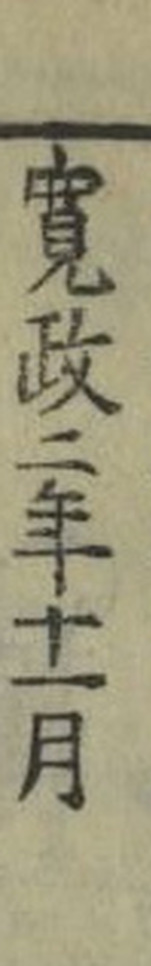寛政二年十一月同
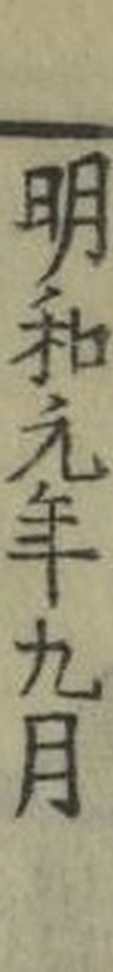明和元年九月同
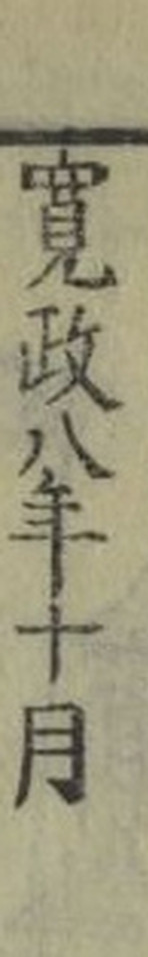寛政八年十月同
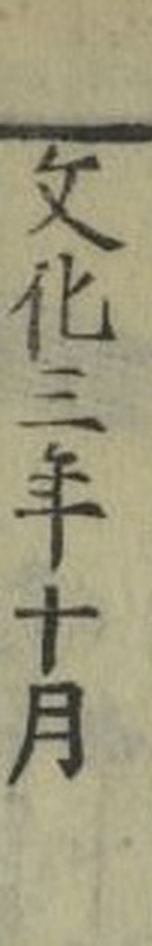文化三年十月同
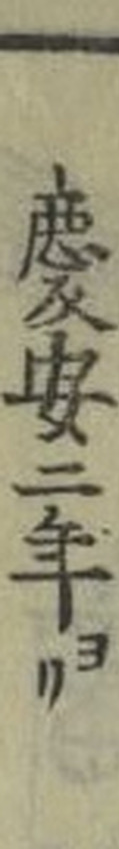慶安二年ヨリ
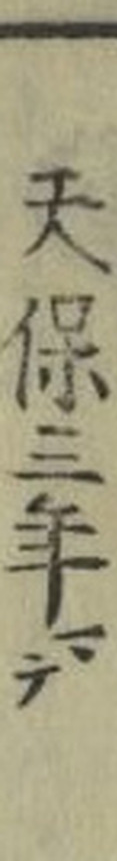天保三年マテ
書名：[琉球人行列記]
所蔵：University of the Ryukyus Library
